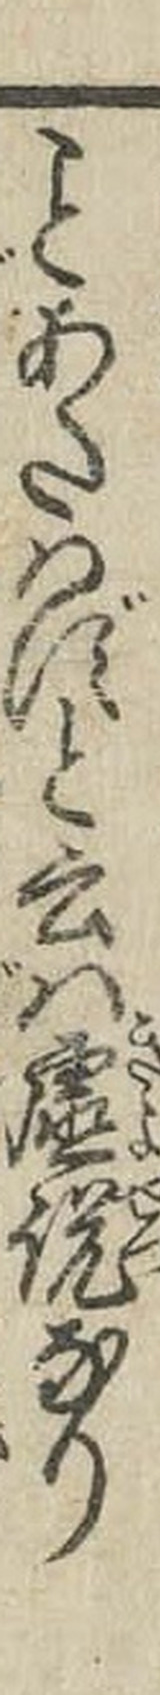ことあたはずと云は虚説なり
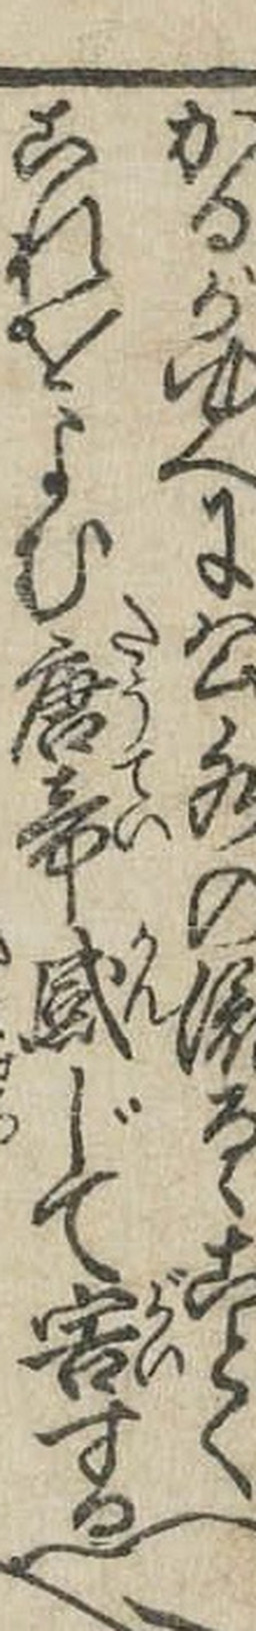これをよむ唐帝感じて害する
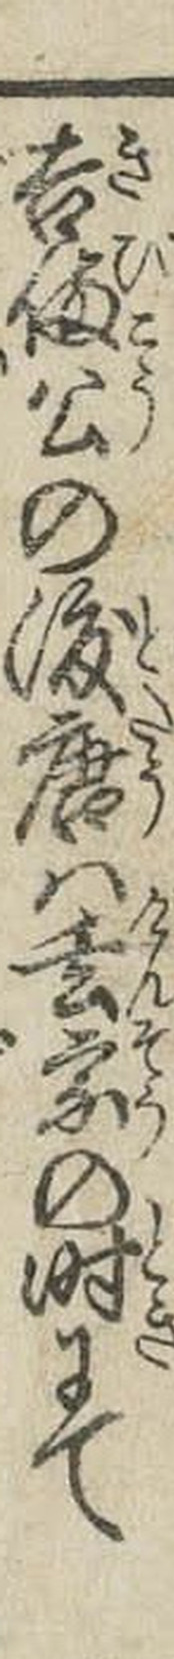吉備公の渡唐は玄宗の時にて
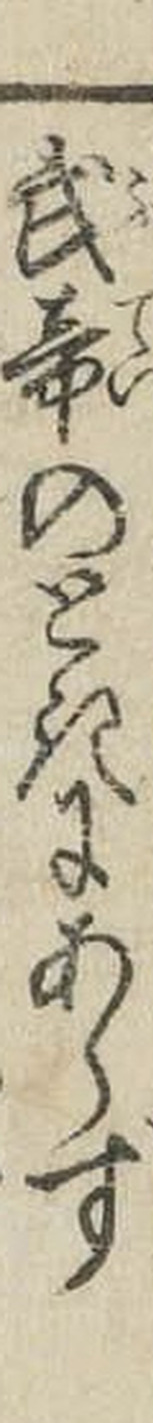武帝のときにあらず
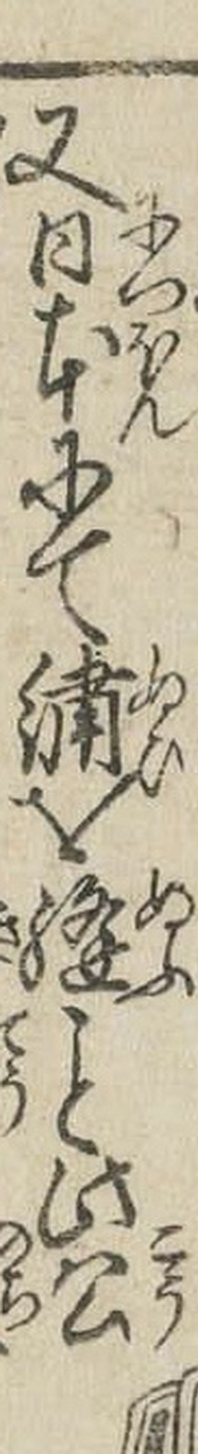又日本にて繍を縫こと此公
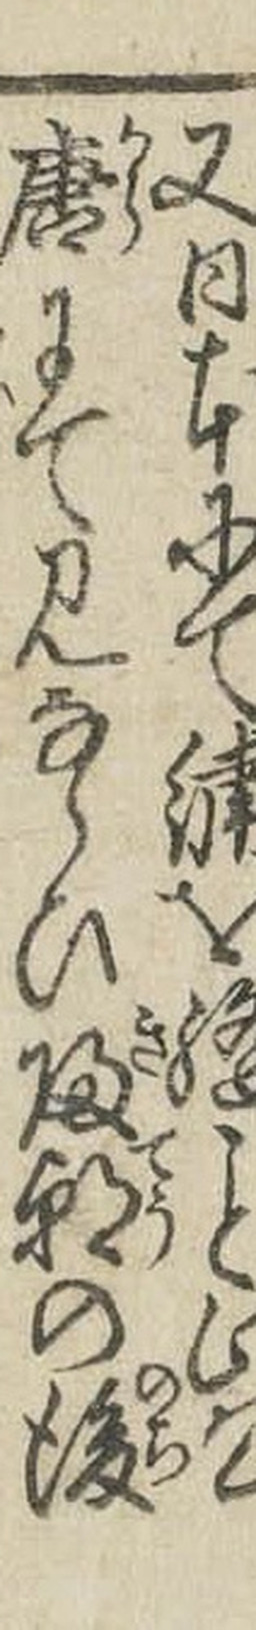唐にて見ならひ帰朝の後
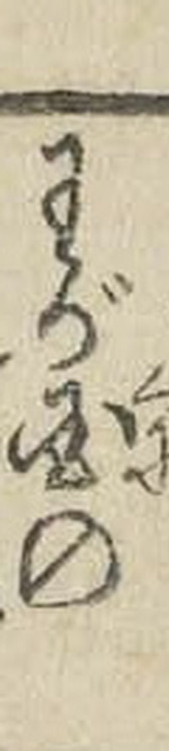わが国の
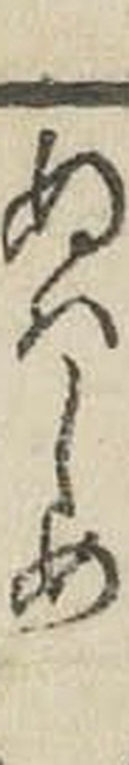ぬはしめ
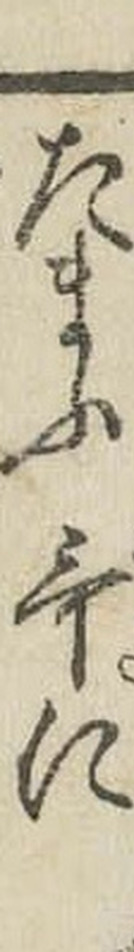たまふ哥に
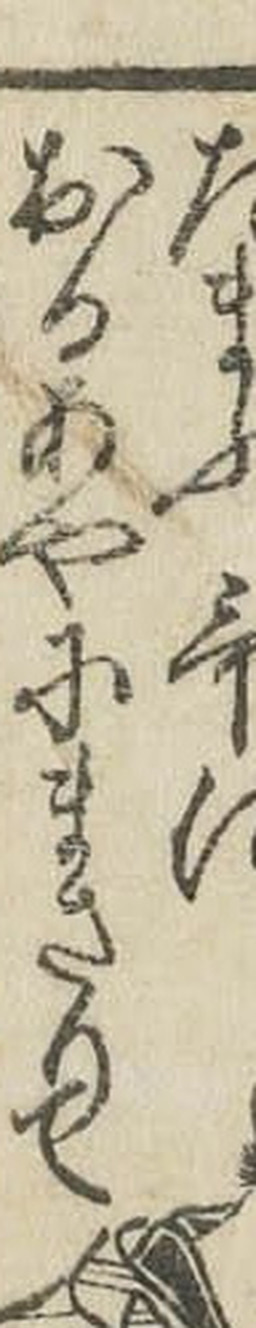おるあやにまさりて
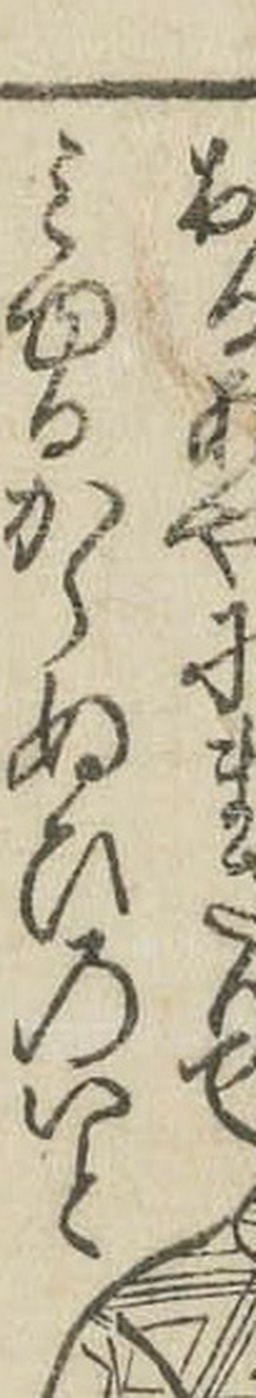みゆるからぬひのいと
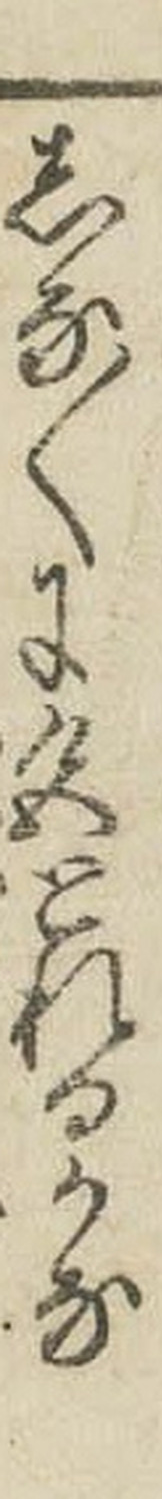しな〳〵に色とれるかな
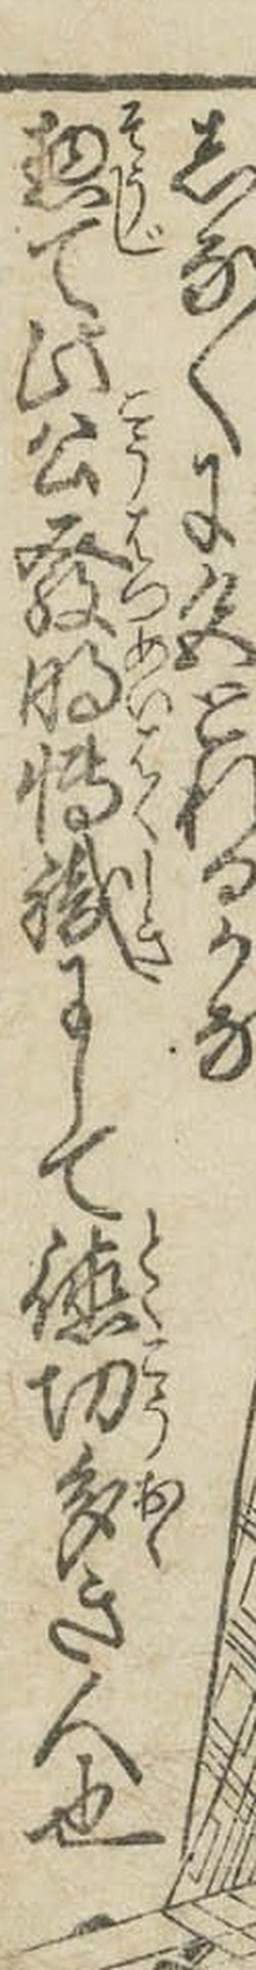惣て此公発明博識にして徳功多き人也
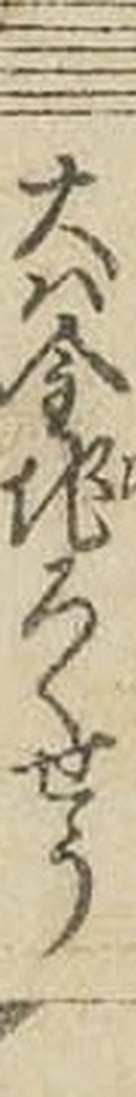大は金地ろくせう
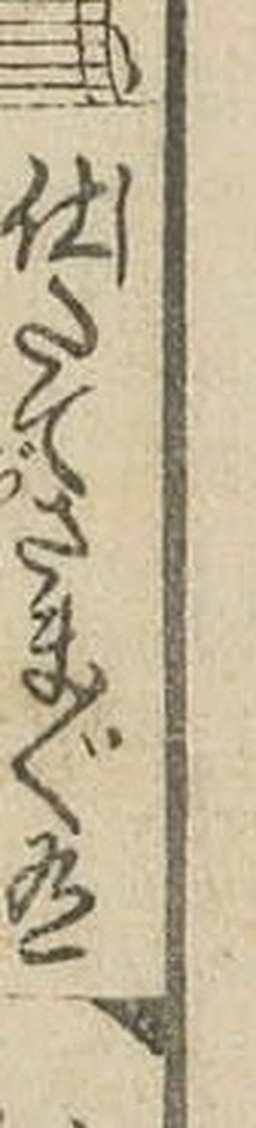仕たてさま〴〵有
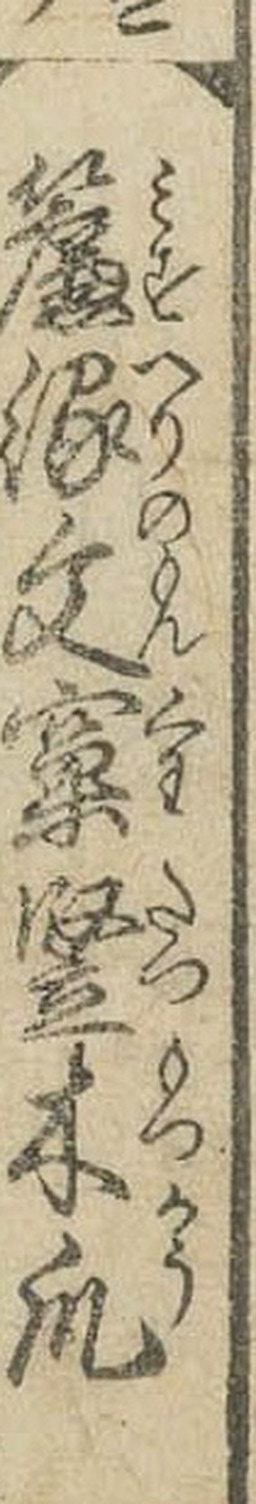簾縁文窠堅木瓜
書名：絵本写宝袋 9巻 1之巻
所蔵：東京学芸大学教育コンテンツアーカイブ
